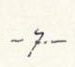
7
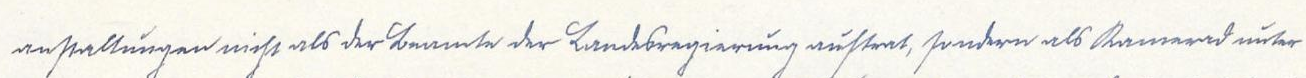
anstaltungen nicht als der Beamte der Landesregierung auftrat, sondern als Kamerad unter
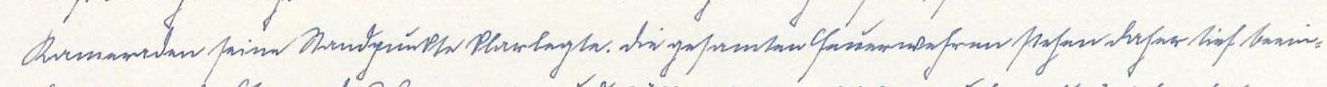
Kameraden seine Standpunkte klarlegte. Die gesamten Feuerwehren stehen daher tief beein-
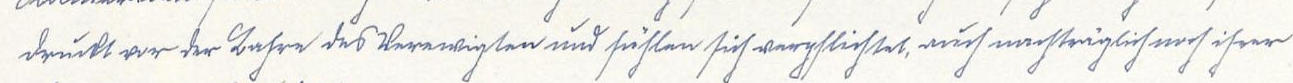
druckt vor der Bahre des Verewigten und fühlen sich verpflichtet, auch nachträglich noch ihrer
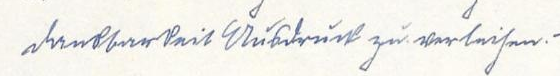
Dankbarkeit Ausdruck zu verleihen.
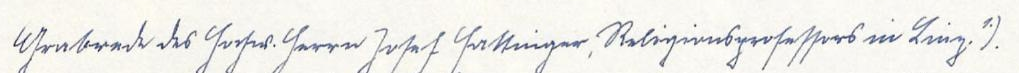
Grabrede des Hochw. Herrn Josef Fattinger, Religionsprofessors in Linz 1)
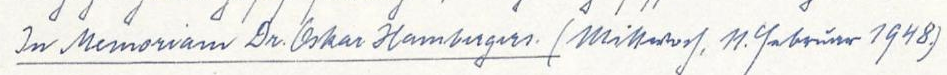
In Memoriam Dr. Oskar Hamberger (Mittwoch, 11. Februar 1948)
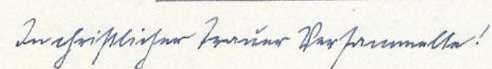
In christlicher Trauer Versammelte!
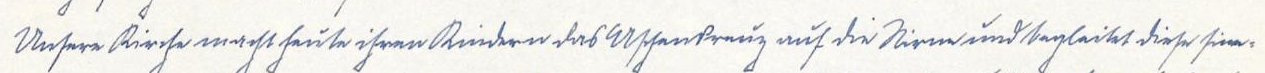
Unsere Kirche macht heute ihren Kindern das Aschenkreuz auf die Stirn und begleitet diese sinn-
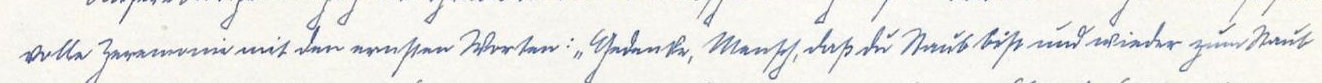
volle Zeremonie mit den ernsten Worten: „Gedenke, Mensch daß du Staub bist und wieder zum Staub
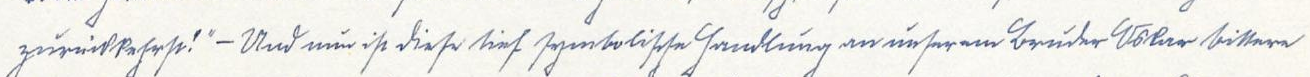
zurückkehrst!“- Und nun ist diese tief symbolische Handlung an unserem Bruder Oskar bittere
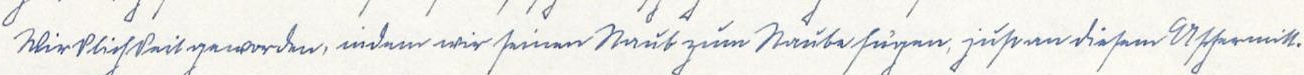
Wirklichkeit geworden, indem wir seinen Staub zum Staube fügen, just an diesem Aschermitt-
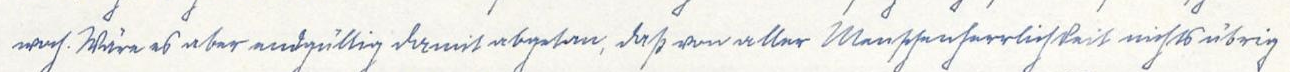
woch. Wäre es aber endgültig damit abgetan, dass von aller Menschenherrlichkeit nichts übrig
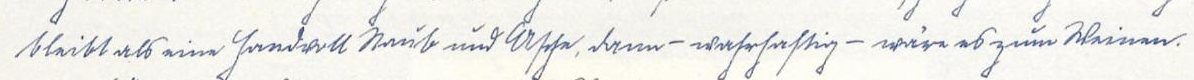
bleibt, als eine Handvoll Staub und Asche, dann-wahrhaftig-wäre es zum Weinen …
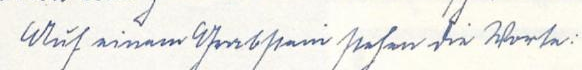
Auf einem Grabstein stehen die Worte:
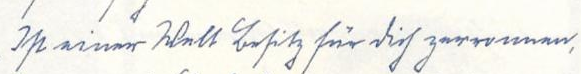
„Ist einer Welt Besitz für dich zerronnen,
